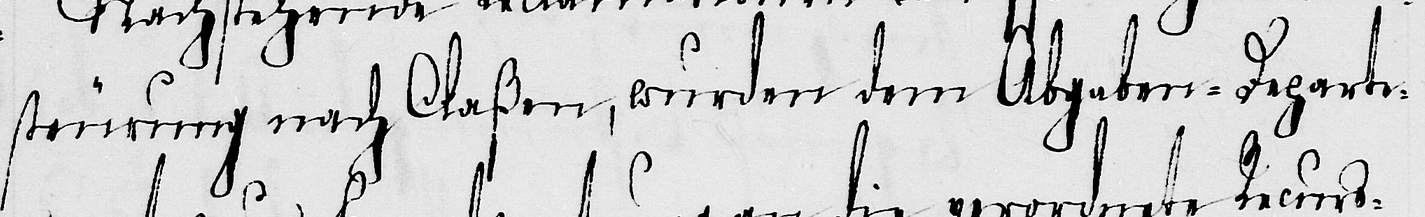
steuerung nach Claßen, wurden dem Abgaben-Departe¬
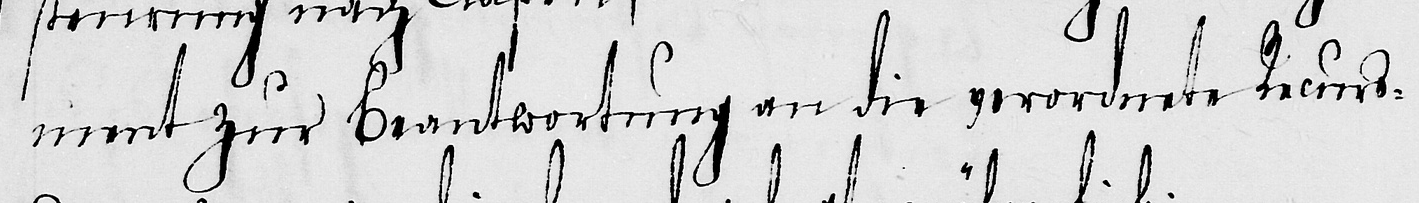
ment zur Beantwortung an die verordnete Recur¬
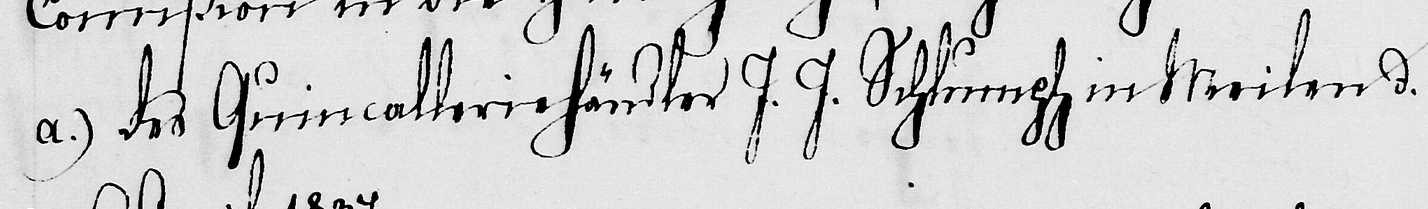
a.) das Quincalleriehändler J. J. Schlumph in Meilen d.
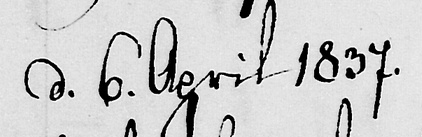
d. 6. April 1837.
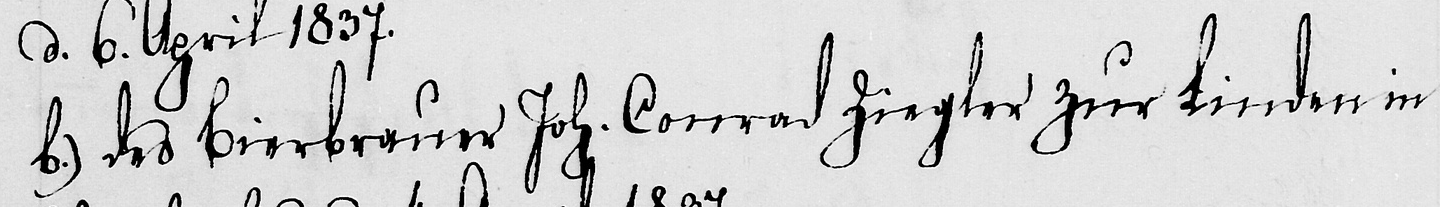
b.) des Bierbrauer Joh. Conrad Ziegler zur Linden in
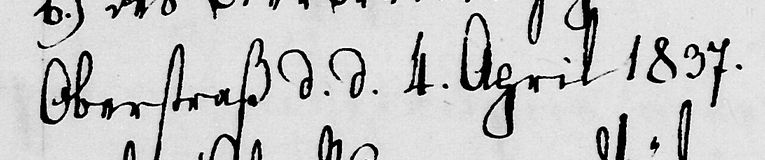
Oberstraß d. d. 4. April 1837.
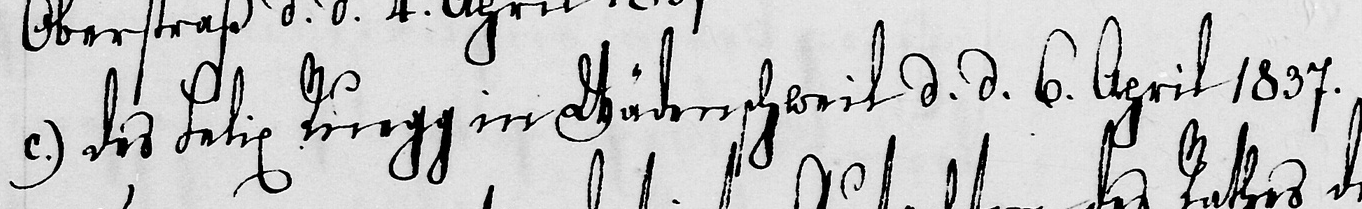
c.) des Felix Ruegg in Wädenschweil d. d. 6. April 1837.
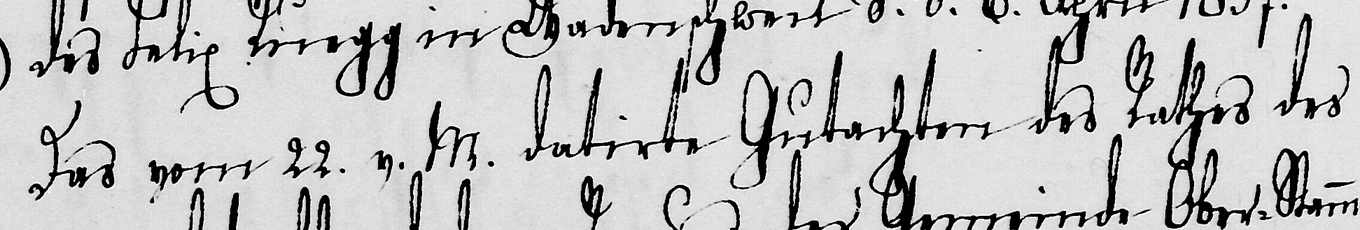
Das vom 22 v. M. datirte Gutachten des Rathes des
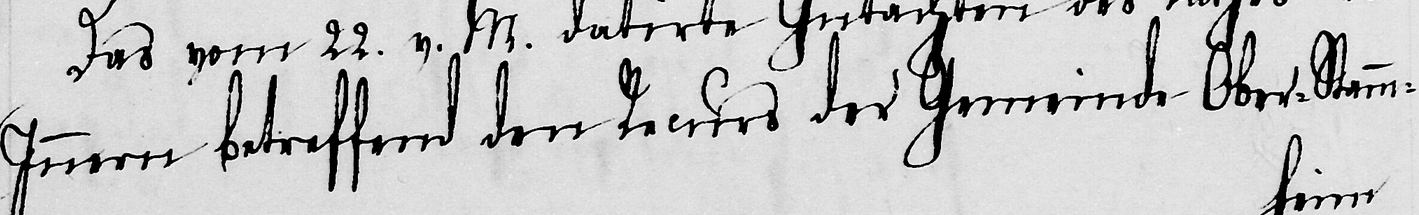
Innern betreffend den Recurs der Gemeinde Ober-Stam¬
